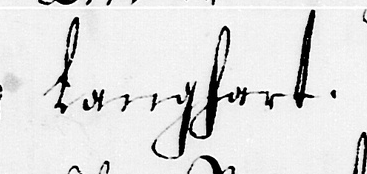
Langhart.
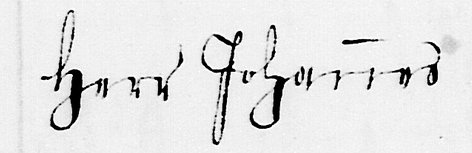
Herr Johannes
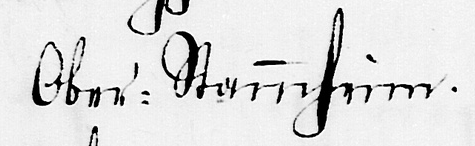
Ober-Stammheim.
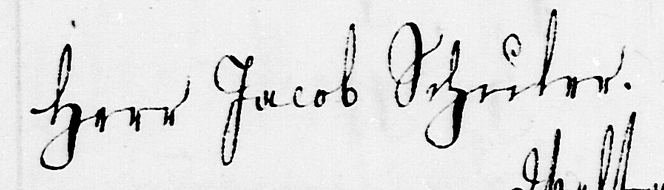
Herr Jacob Schuler.
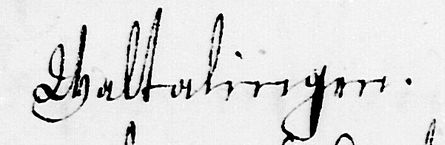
Waltalingen.
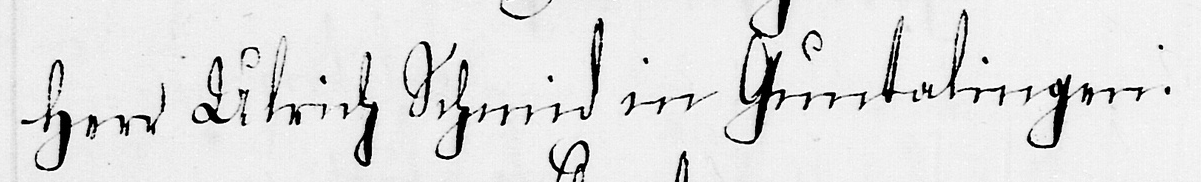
Herr Ulrich Schmid in Guntalingen.
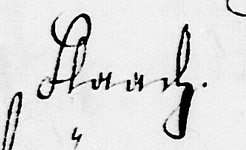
Flaach.
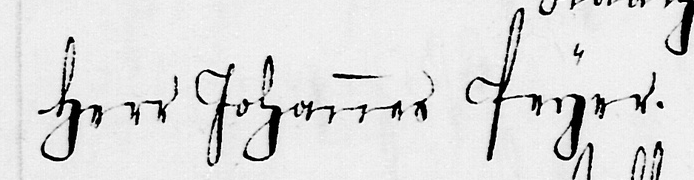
Herr Johannes Peyer.
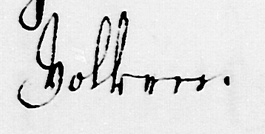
Volken.
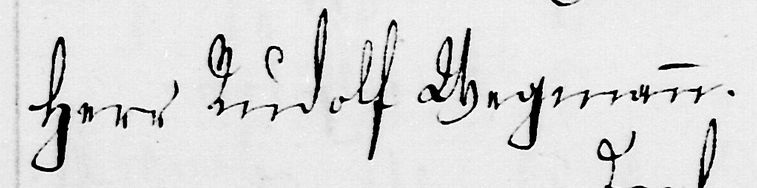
Herr Rudolf Wegmann.
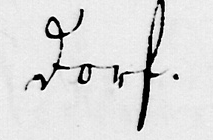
Dorf.
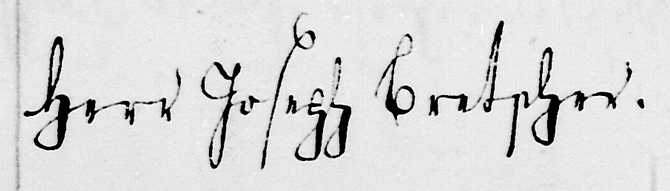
Herr Joseph Bretscher.
